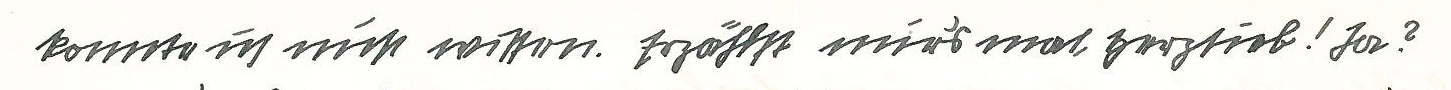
konnte ich nicht wissen. Erzählst mir’s mal, Herzlieb! Ja?
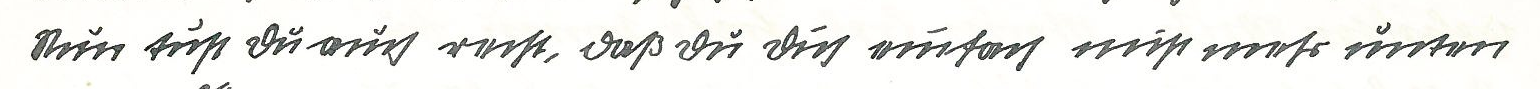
Nun tust Du auch recht, daß Du Dich einfach unten nicht mehr
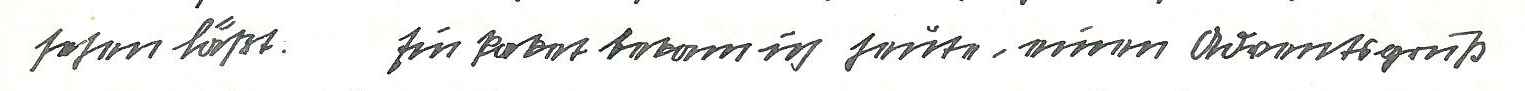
sehen läßt. Ein Paket bekam ich heute, einen Adventsgruß
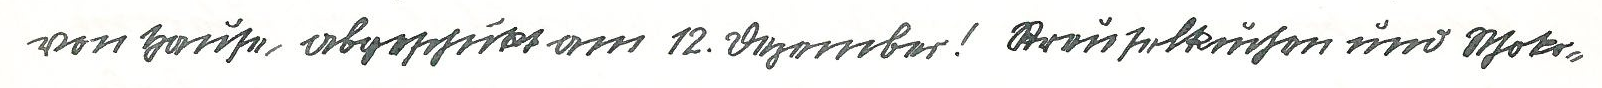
von Hause, abgeschickt am 12. Dezember! Streuselkuchen und Schoko¬
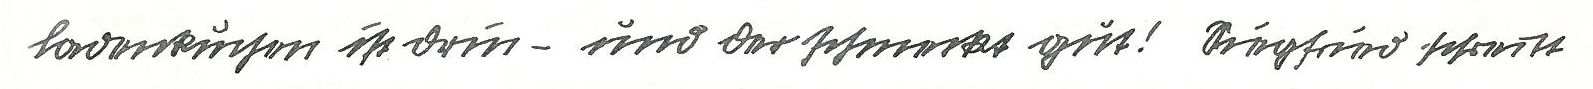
ladenkuchen ist drin – und der schmeckt gut! S. schreibt
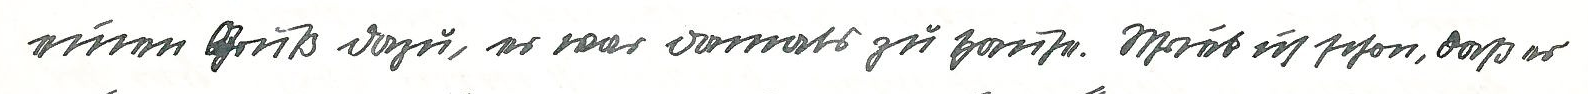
einen Gruß dazu, er war damals zu Hause. Schrieb ich schon, daß er
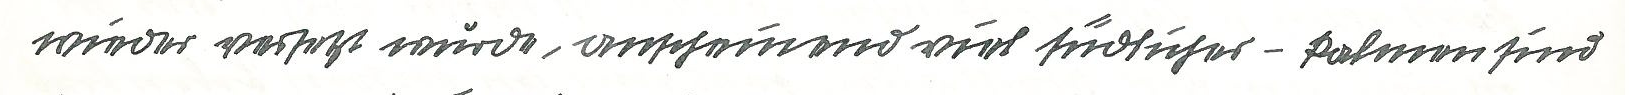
wieder versetzt wurde, anscheinend viel südlicher – Palmen sind
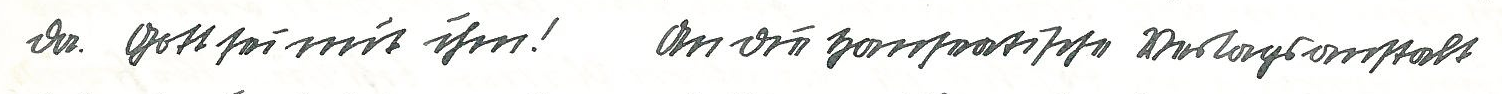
da. Gott sei mit ihm! An die Hanseatische Verlagsanstalt
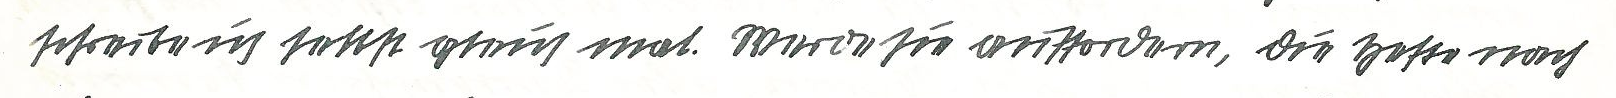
schreibe ich selbst gleich mal. Werde sie auffordern, die Hefte nach
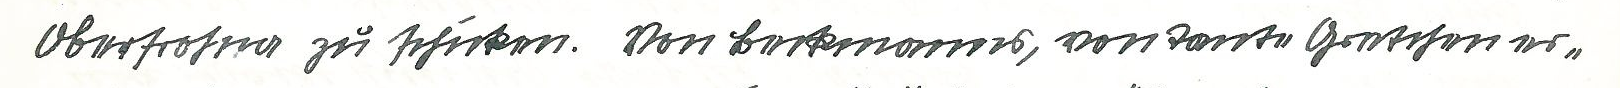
O. zu schicken. Von B., von Tante G. er¬
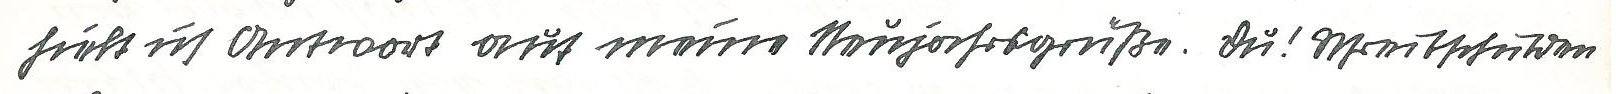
hielt ich Antwort auf meine Neujahrsgrüße. Du! Schreibschulden
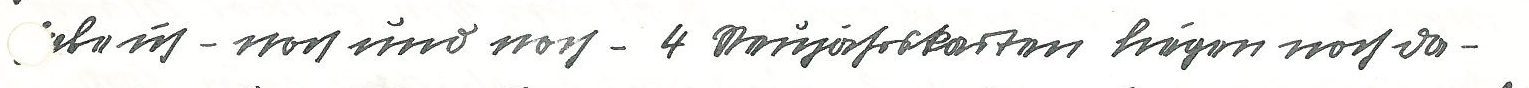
habe ich – noch und noch – 4 Neujahrskarten liegen noch da –
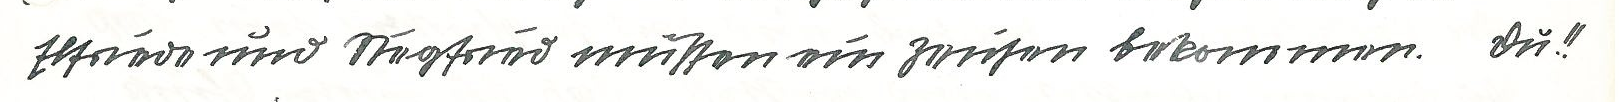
E. und S. müssen ein Zeichen bekommen. Du!!
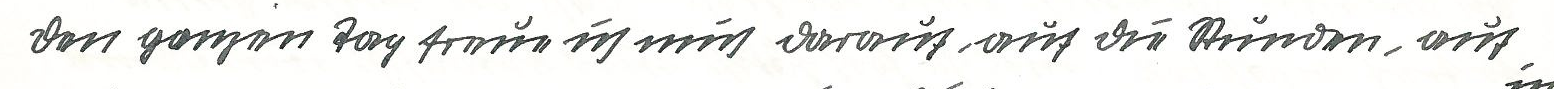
Den ganzen Tag freue ich mich darauf, auf die Stunden, auf
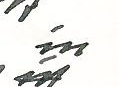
in
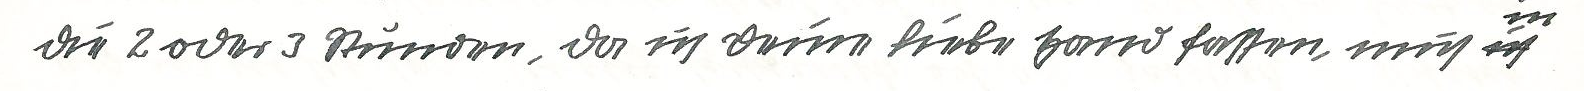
die 2 oder 3 Stunden, da ich Deine liebe Hand fassen, mich
